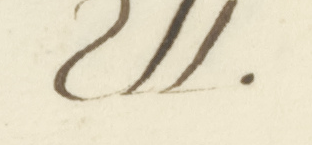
211.
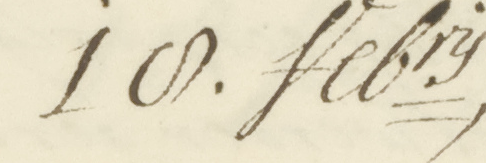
18. Febrij.
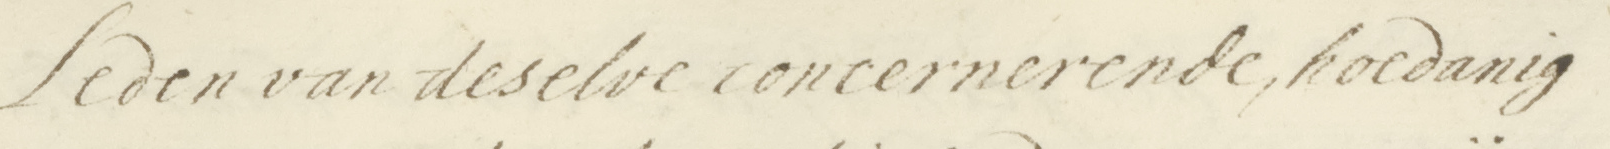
leden van deselve concernerende, hoedanig
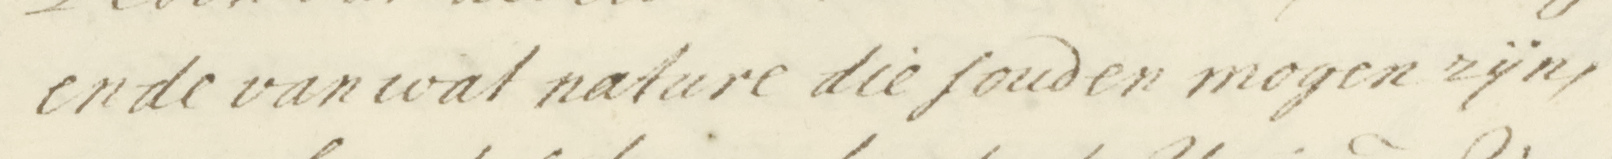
ende van wat nature die souden mogen zijn,
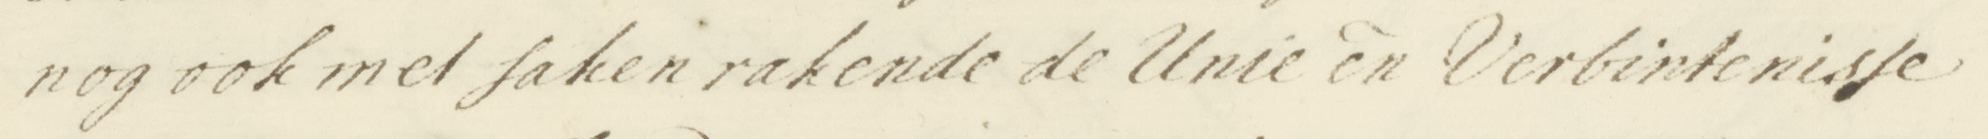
nog ook met saken rakende de Unie en Verbintenisse
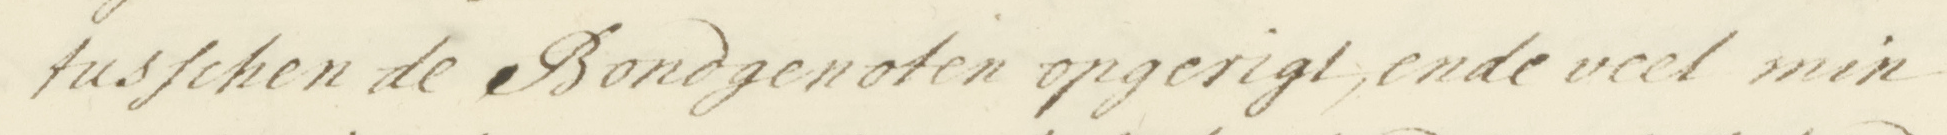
tusschen de Bondgenoten opgerigt, ende veel min
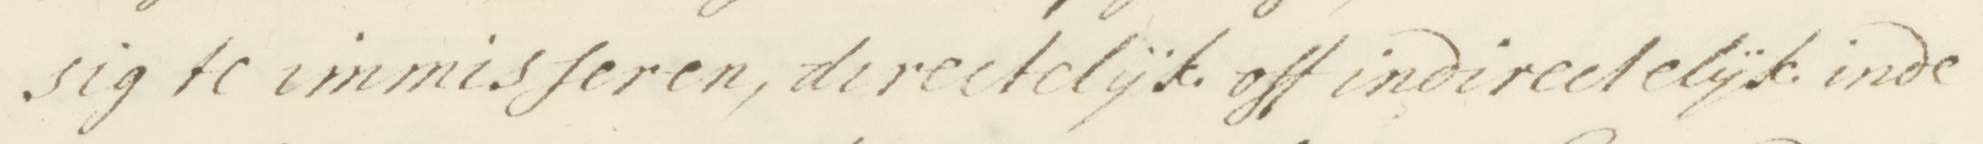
sig te immisseren, directelijk oft indircetelijk inde
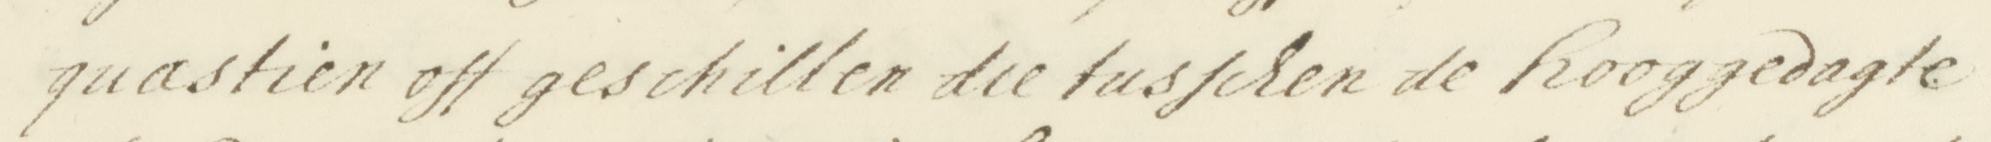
quastien off geschillen die tusschen de hooggedagte
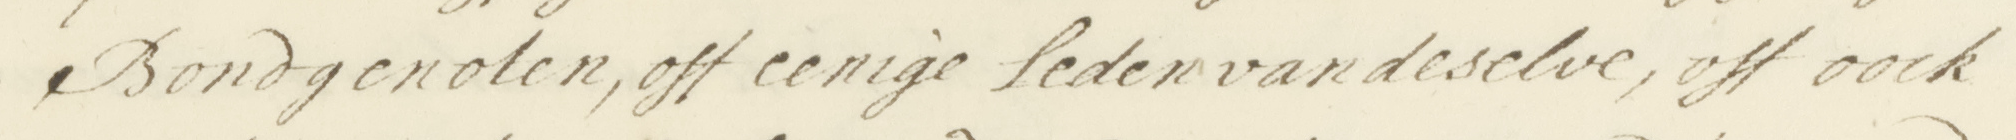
Bondgenoten, off eenige leden van deselve, off oock
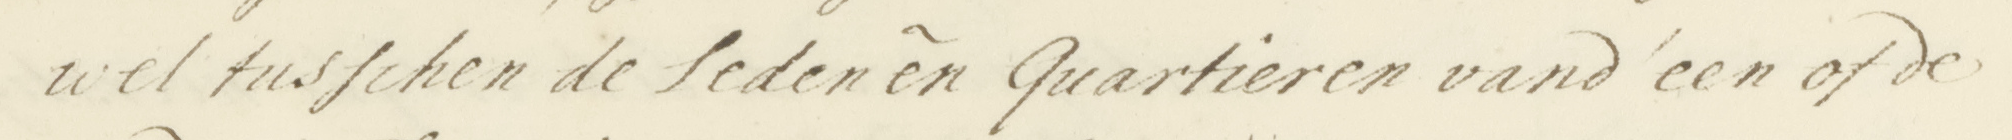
wel tusschen de leden en quartieren vand'een of de
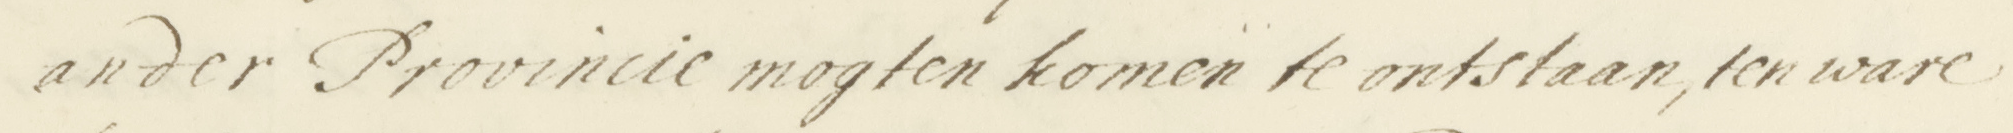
ander Provincie mogten komen te ontstaan, ten ware
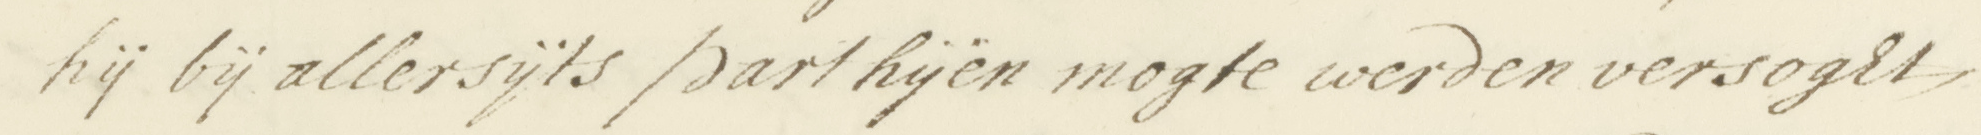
hij bij allersijts parthijen mogte werden versoght,
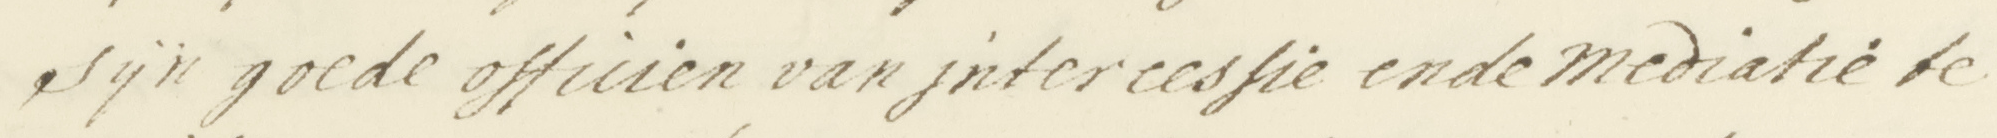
sijn goede officien van intercessie ende mediatie te
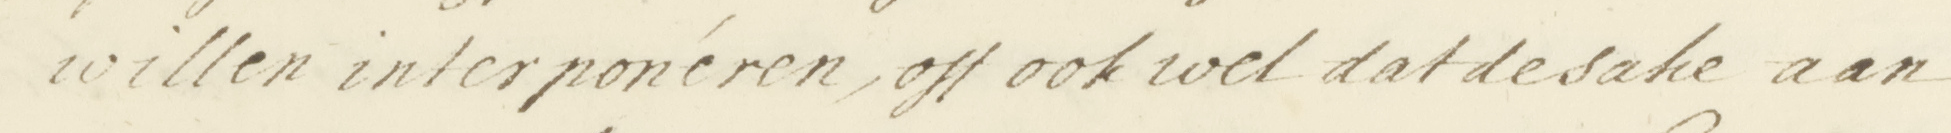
willen interponeren, off ook wel dat de sake aan
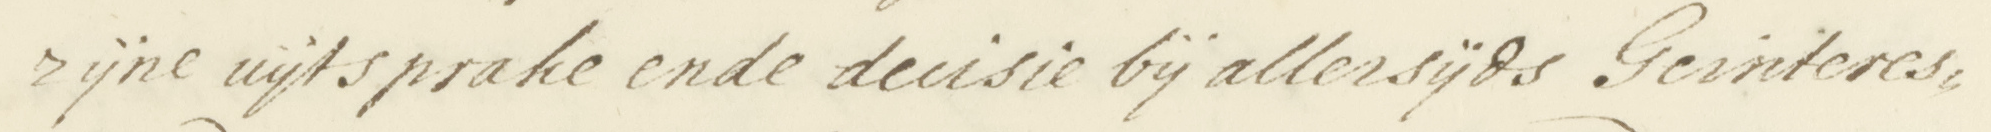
zijne uijtsprake ende decisie bij allersijds Geinteres,,
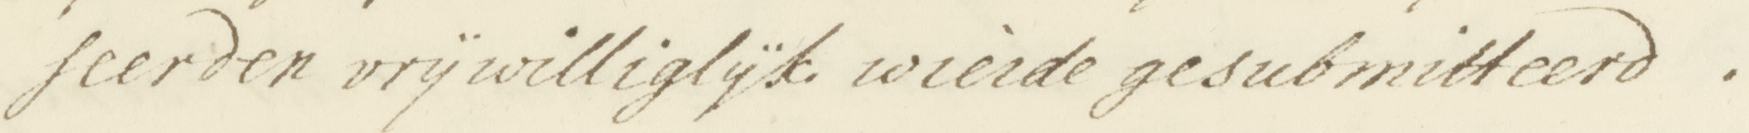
seerden vrijwilliglijk wierde gesubmitteerd.
